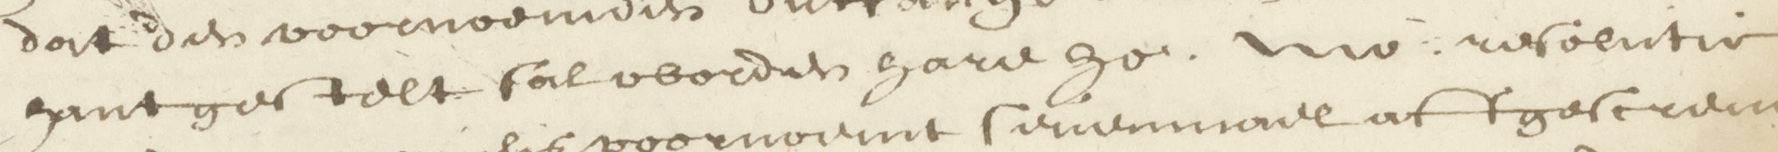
hant gestelt sal worden hare Ho:Mo: resolutie
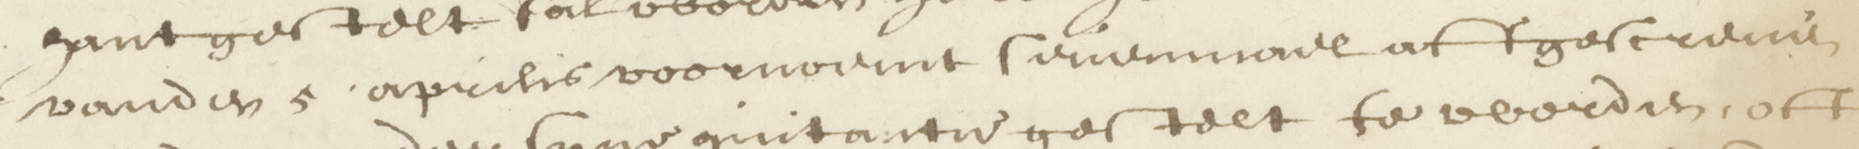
vanden 5. aprilis voornoemt seuenmael affgescreuen
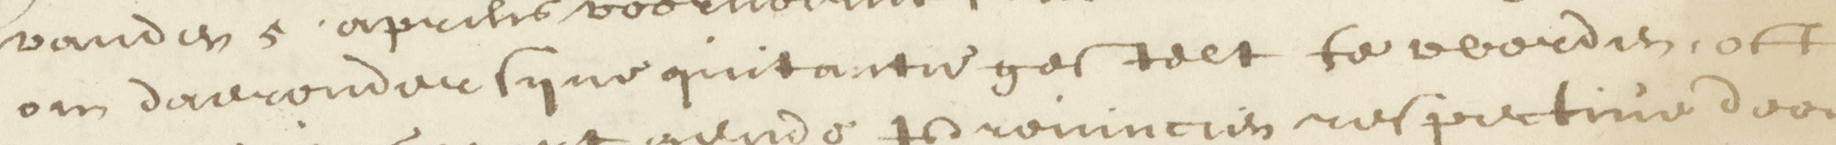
om daeronder syne quitantie gestelt te worden, off
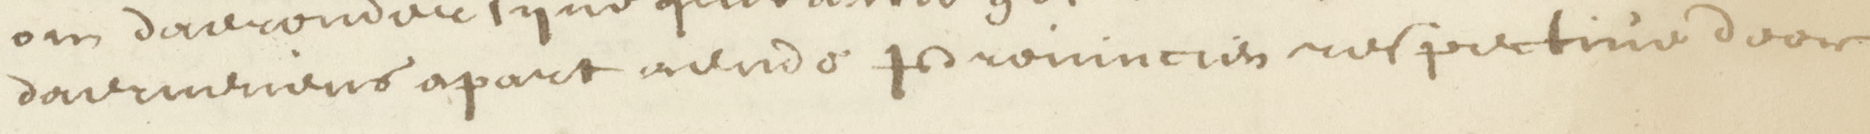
daerneuens apart aende prouincien respectiue door
